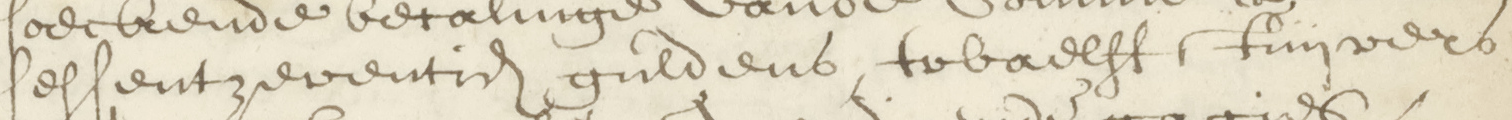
sessentzeventich guldens, twaelff stuijvers
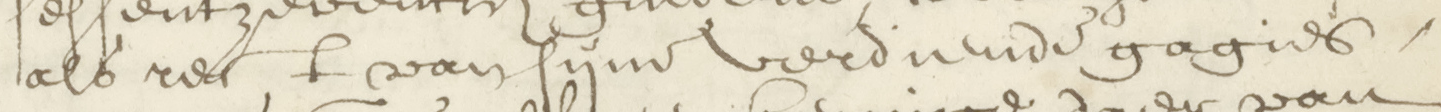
als rest van sijne verdiende gagies,
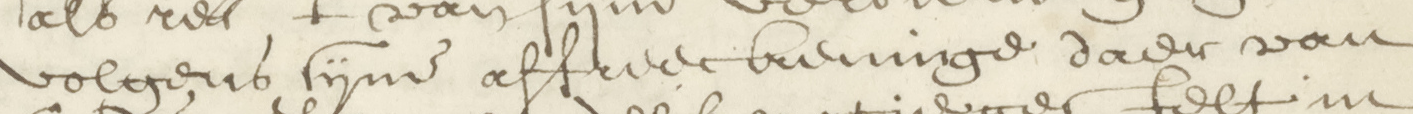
volgens sijne affreeckeninge daer van
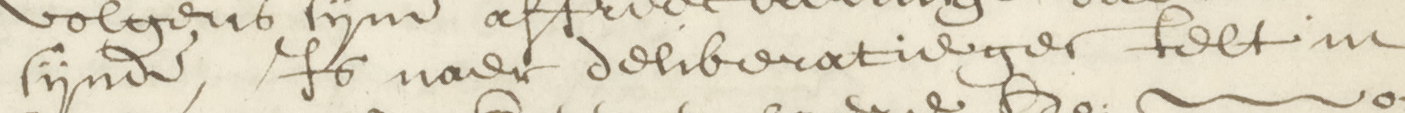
sijnde, Is naer deliberatie gestelt in
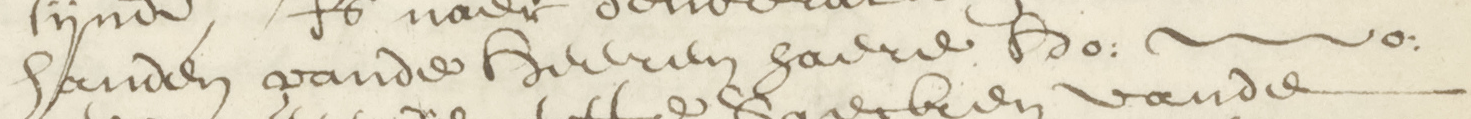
handen vande Heeren haere Ho:Mo:
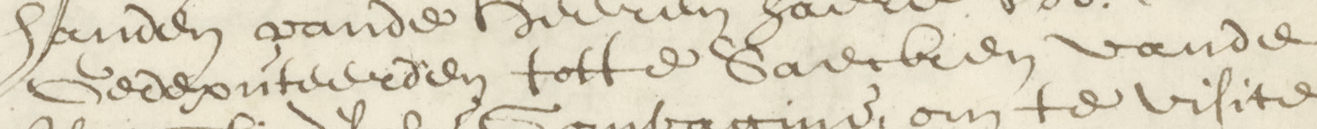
Gedeputeerden totte Saecken vande
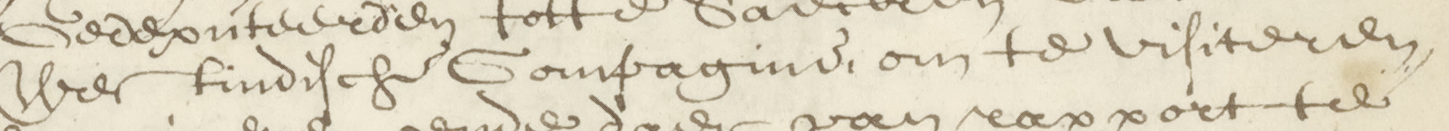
Westindische Compagnie, om te visiteren,
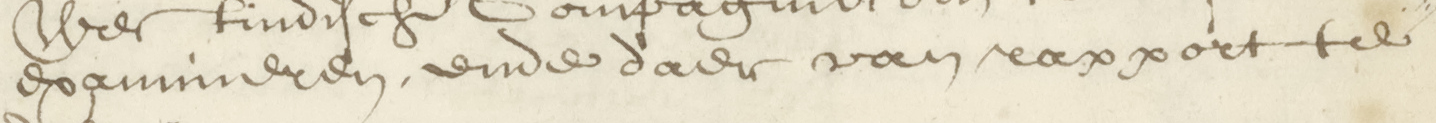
examineren, ende daer van rapport te
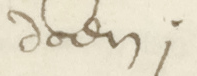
doen.
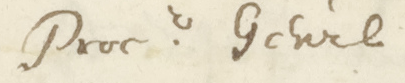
Procr. Genrl
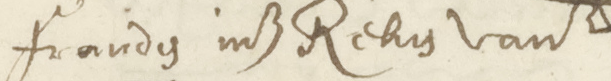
Frauden in Rekn van
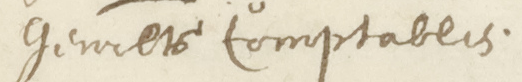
Genrlts Comptablis.
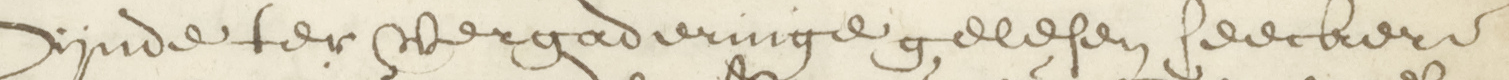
Sijnde ter Vergaderinge gelesen seeckere
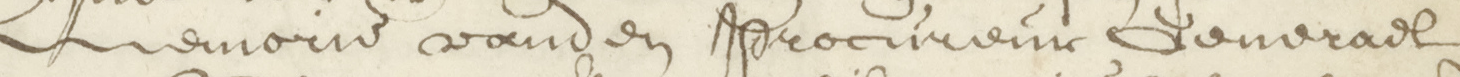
memorie vanden Procureur Generael
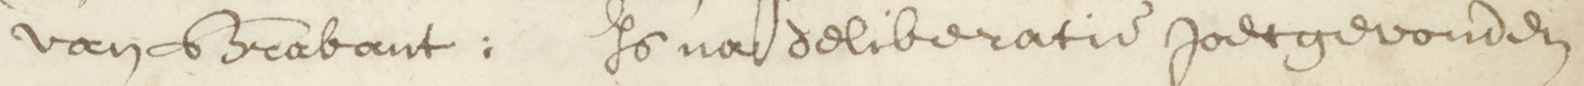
van Brabant: Is na deliberatie goetgevonden
